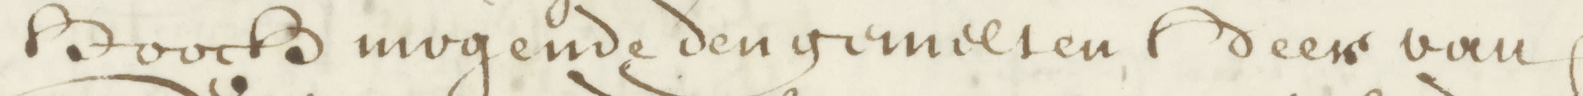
Hooch Mogende den gemelten heer van
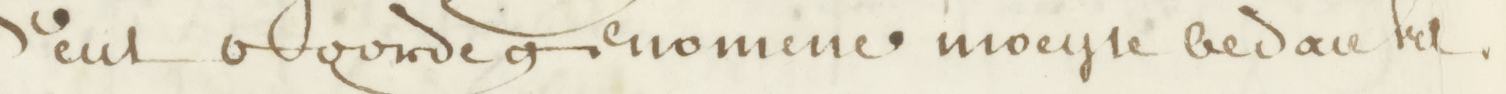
Gent voorde genomene moeijte bedankt.
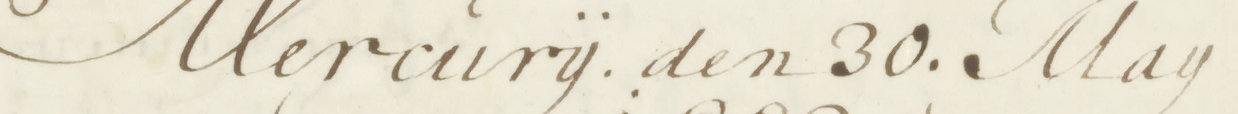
Mercurij den 30. May
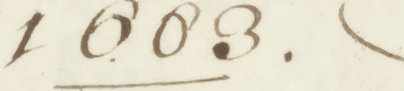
1663.
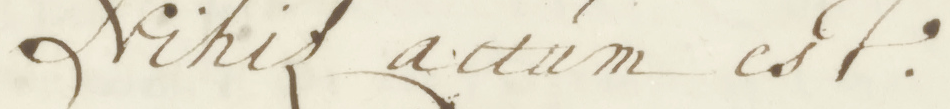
Nihil actum est.
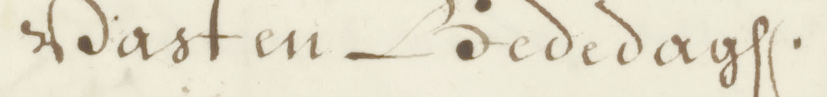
Vasten Bededagh
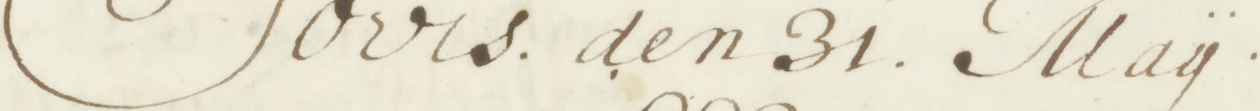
Jovis den 31. Maij
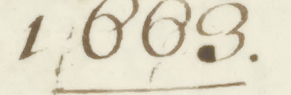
1663.
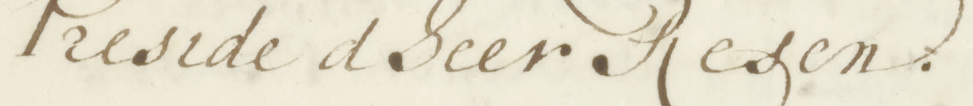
Preside d'heer Resen.
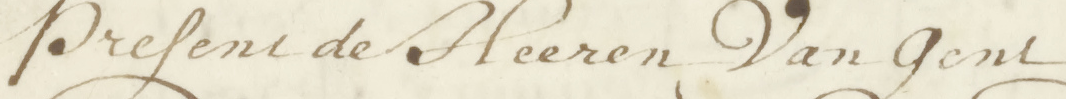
Presens de Heeren van Gent
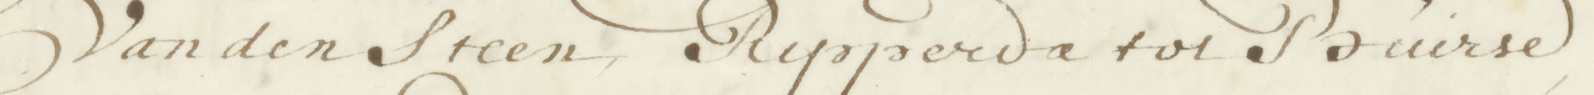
van den Steen, Ripperda tot Buirse,
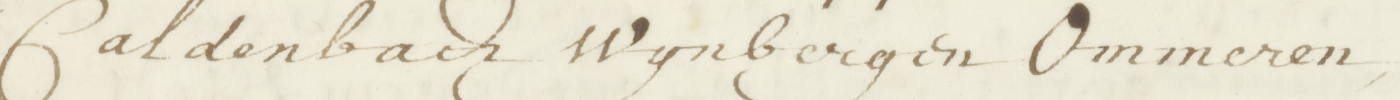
Caldenbach Wijnbergen Ommeren,
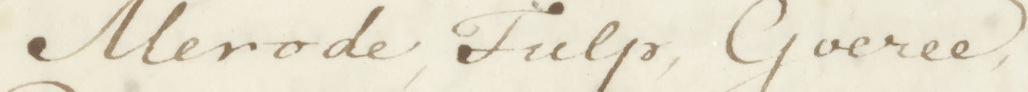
Merode, Tulp, Goeree,
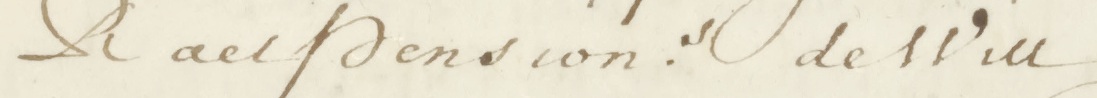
Raetpensions de Witt
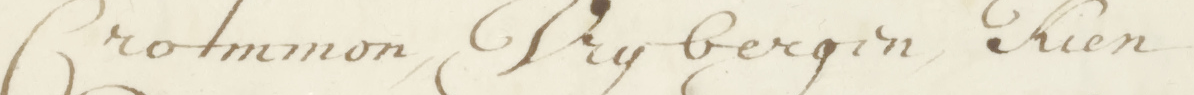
Crommon, Vrijbergen, Kien,
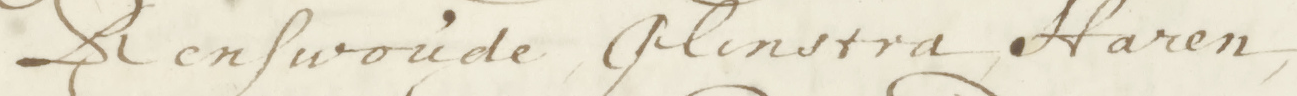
Renswoude, Glinstra, Haren,
